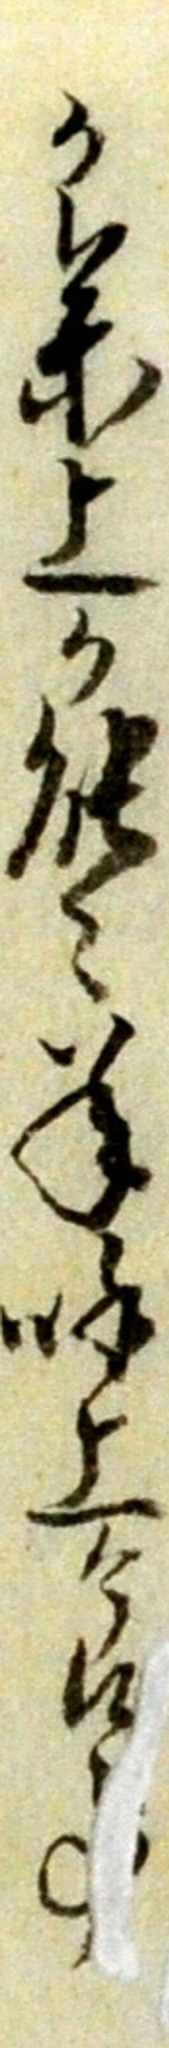可参上り能々承呼上ケ候事
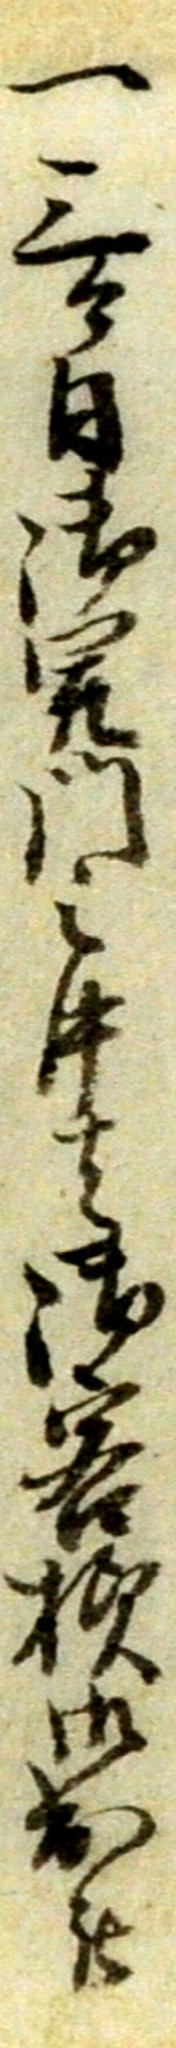一三ケ日御開門之中者御客様御出被
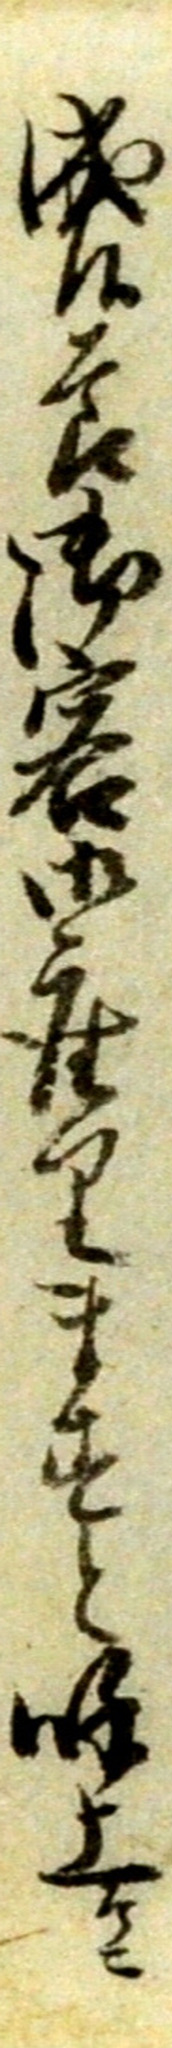成候節御客御座りますと呼上ケニ
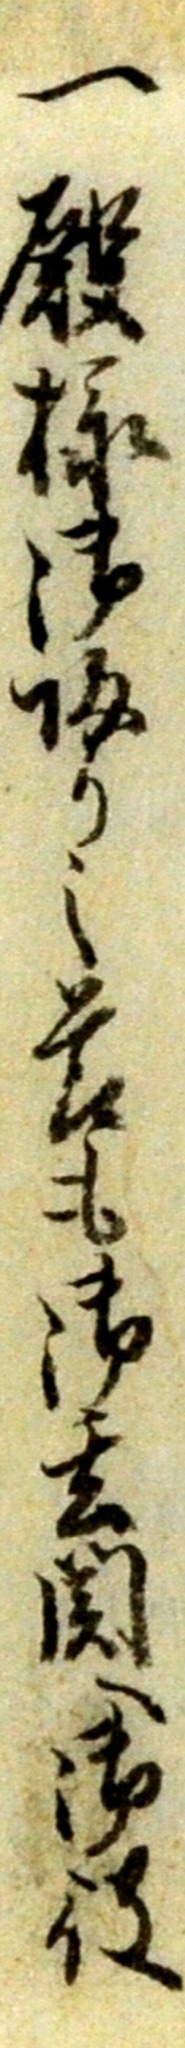一殿様御帰り之節も御玄関へ御役
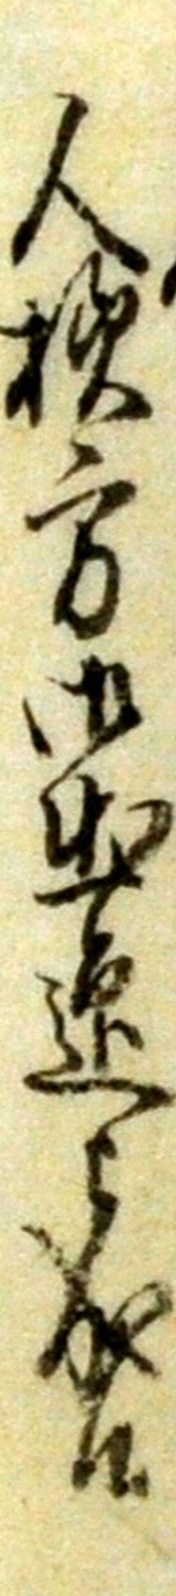人様方御出迎被成候

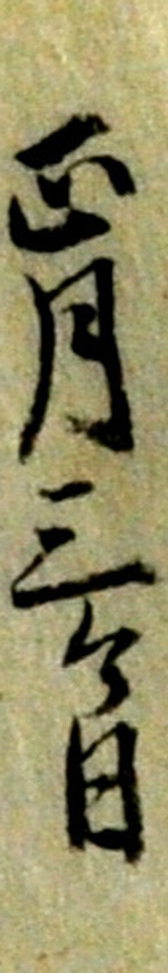正月三ヶ日
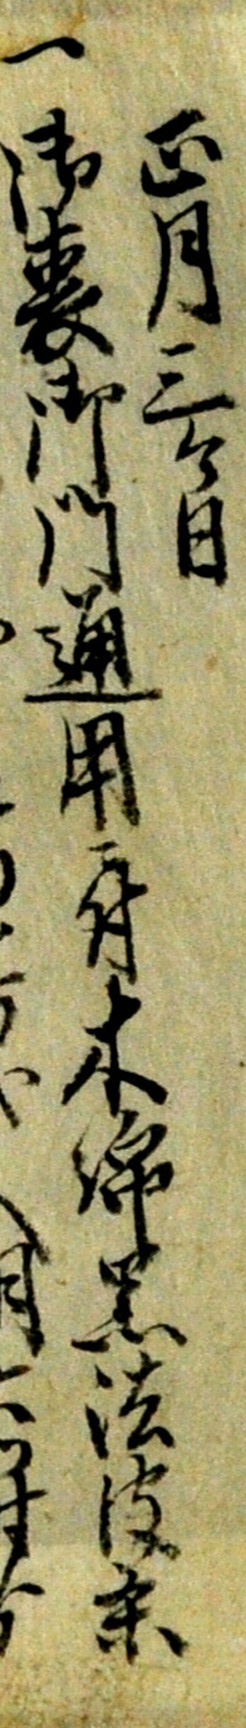一御裏御門通用ニ付木綿黒法被茶
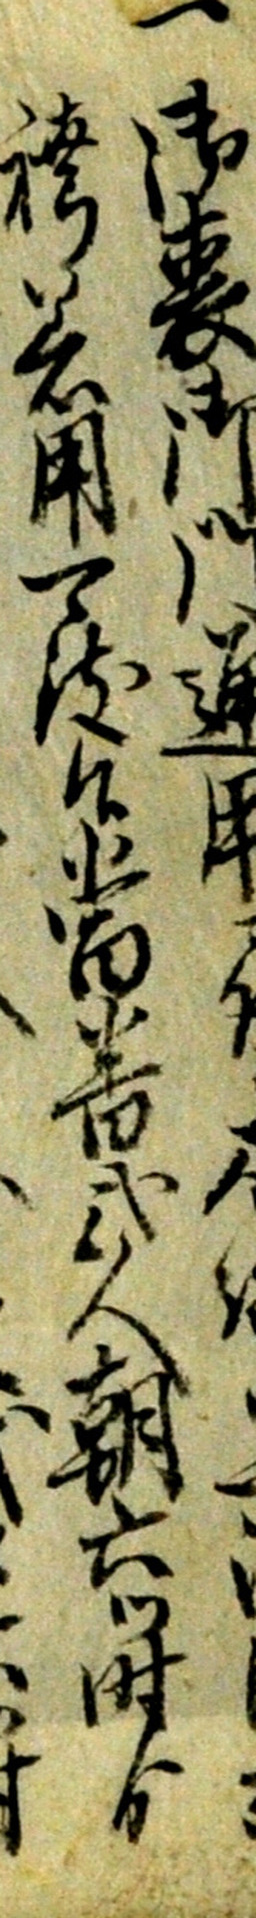袴着用可致候当番弐人朝六ツ時ゟ
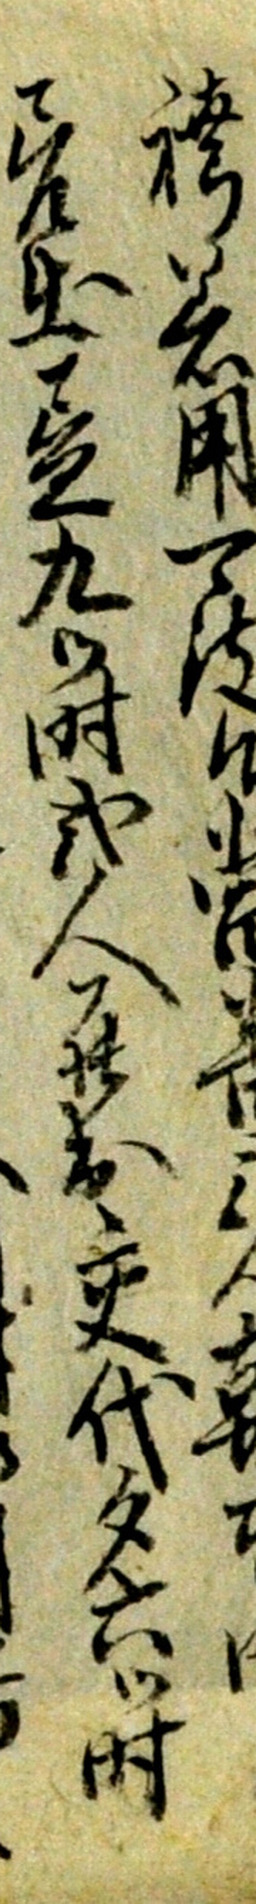差出昼九ツ時弐人罷出交代夕六ツ時
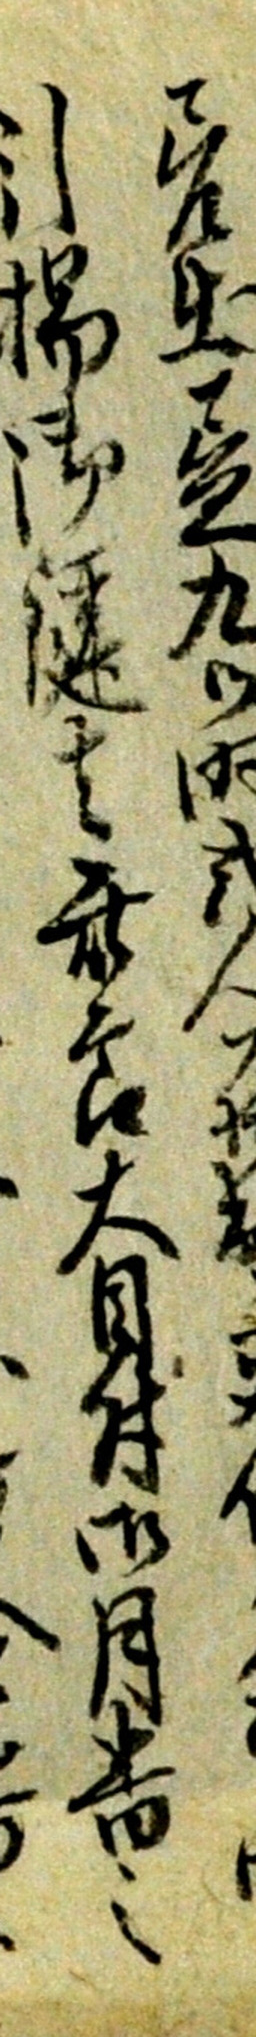引揚御鍵者此節大目付御月番之
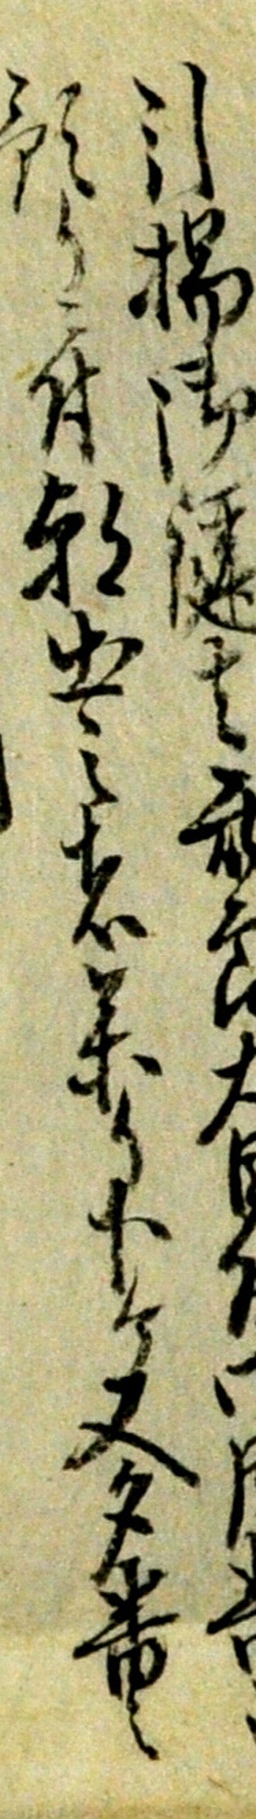預りニ付朝出之者参り下ケ又夕番之
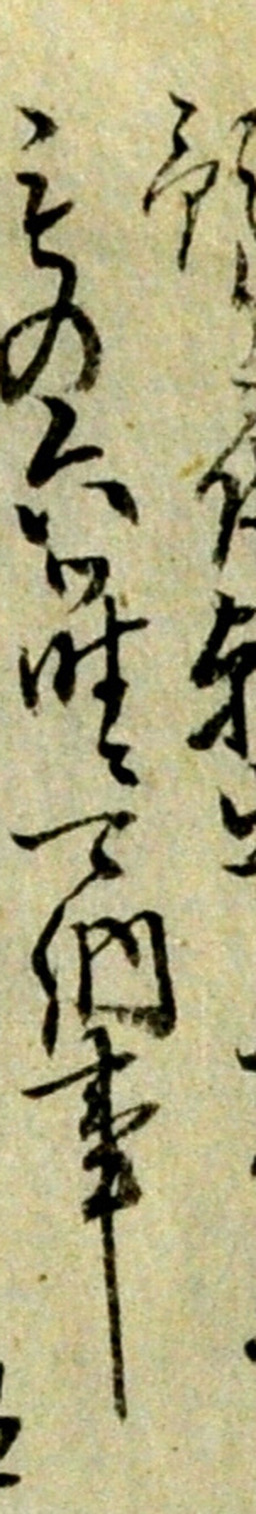もの六ツ時にニ可納事
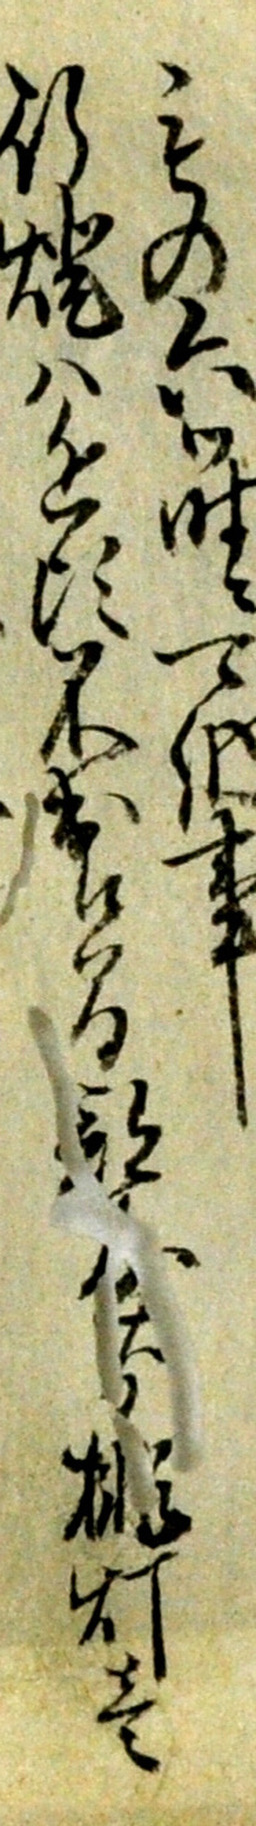行燈ハ近頃不出候間部屋ゟ挑灯壱
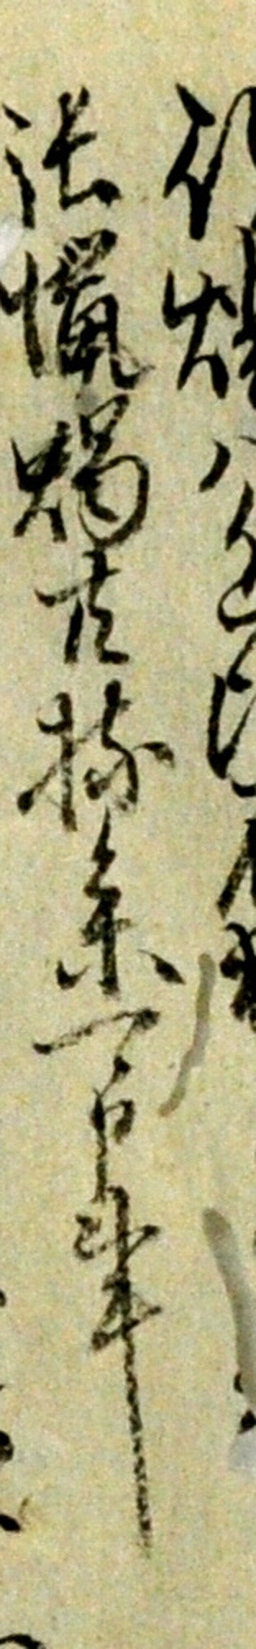張蝋燭供持参可申事
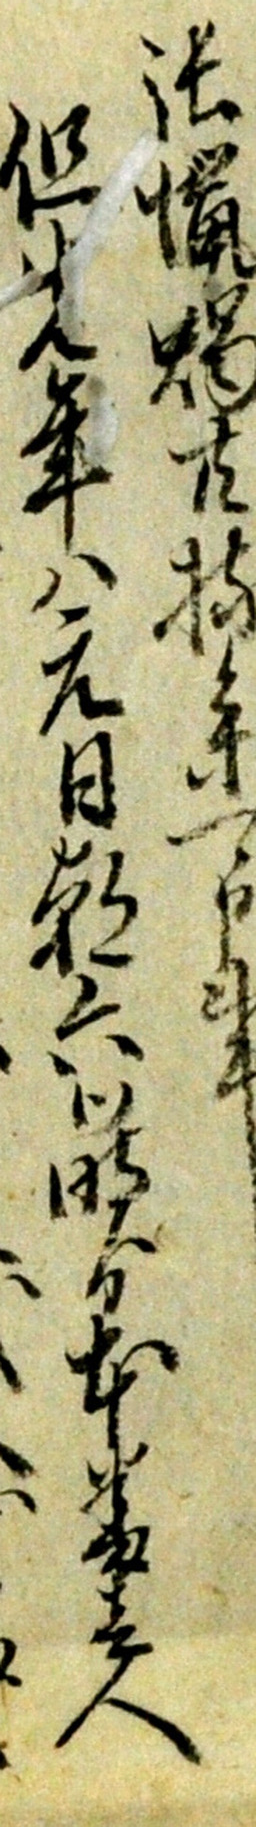但先年ハ元日朝六ツ時ゟ本番壱人
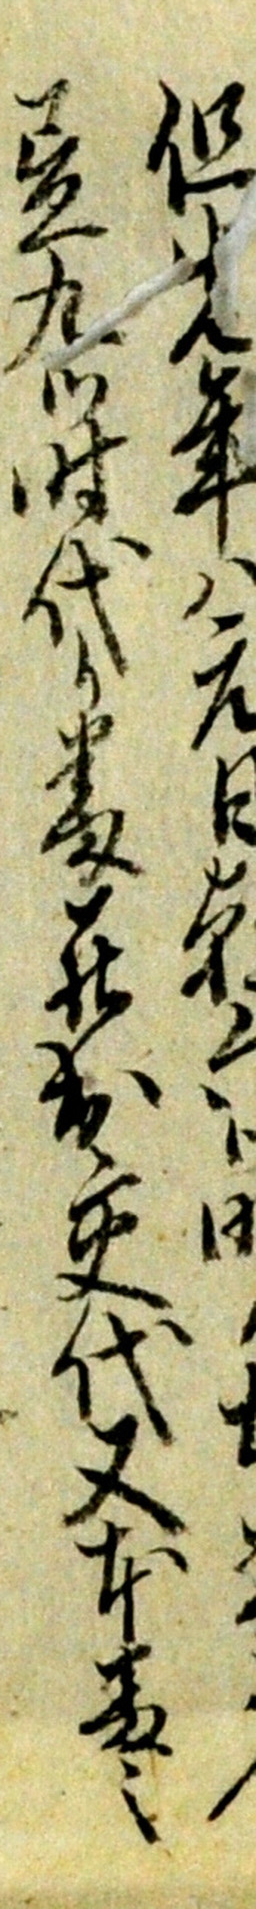昼九ツ時代り番罷出交代又本番之
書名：御先手組江戸御屋敷御門番勤方
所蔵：伊那市立高遠町図書館・合同会社AMANE
